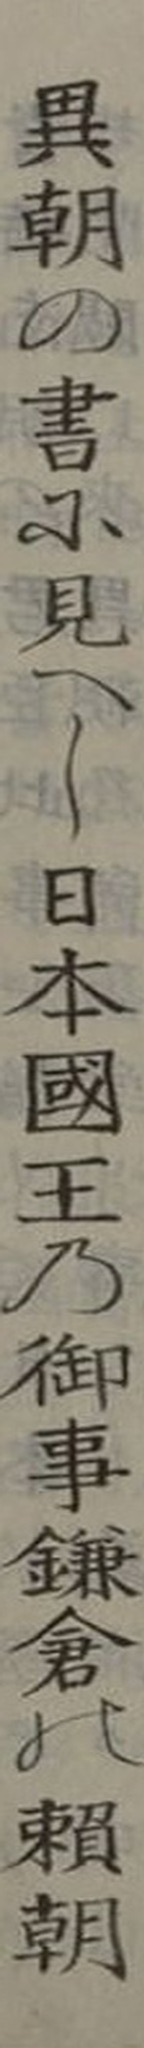異朝の書に見へし日本國王の御事鎌倉の頼朝
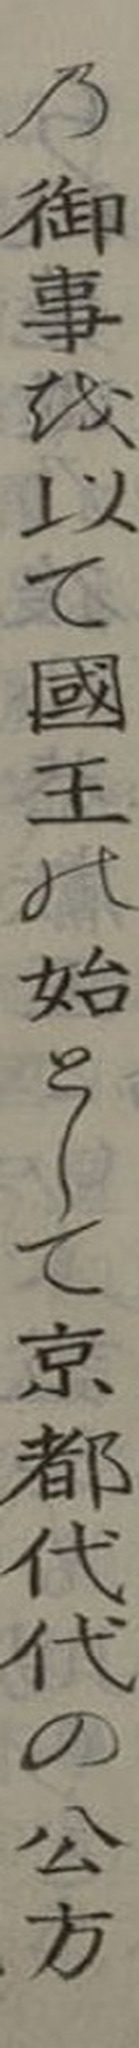の御事を以て國王の始として京都代代の公方
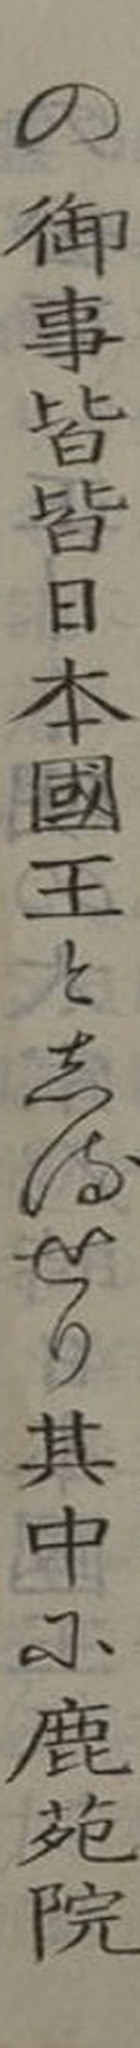の御事皆皆日本國王としるせり其中に鹿苑院

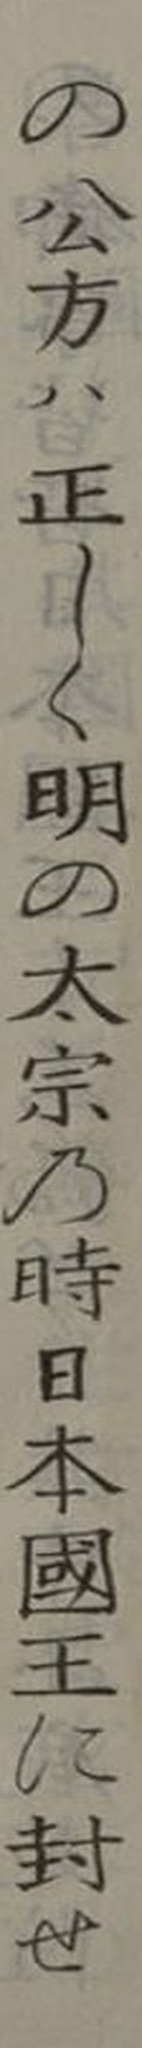の公方ハ正しく明の太宗の時日本國王に封せ
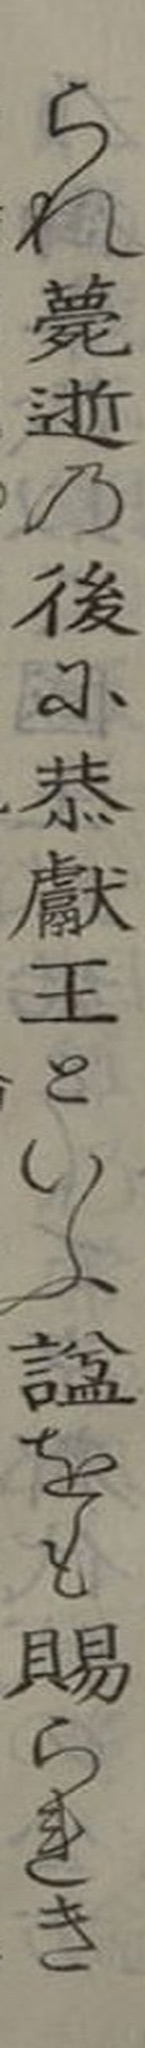られ薨逝の後に恭獻王といふ諡をも賜られき
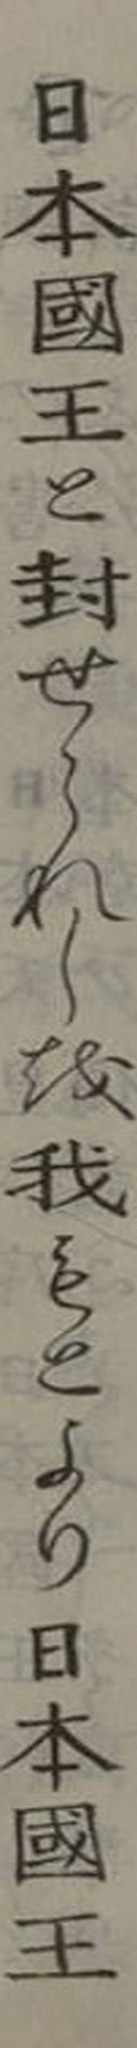日本國王と封せられしを我もとより日本國王
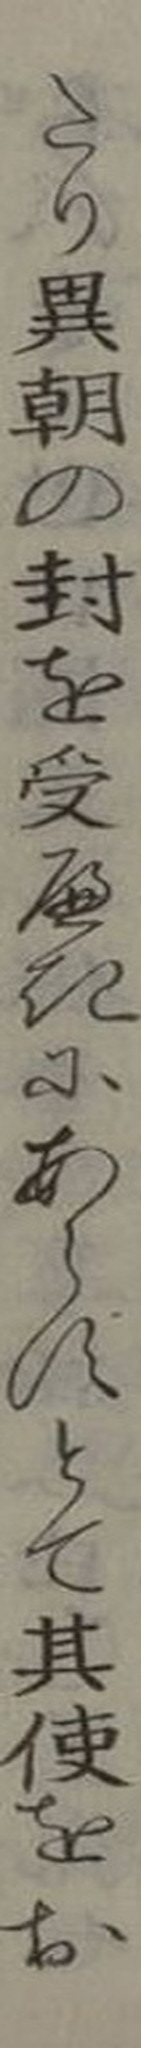たり異朝の封を受へきにあらすとて其使をお
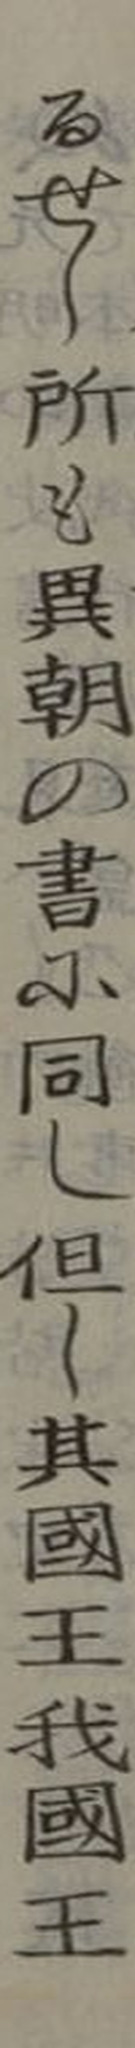るせし所も異朝の書に同し但し其國王我國王
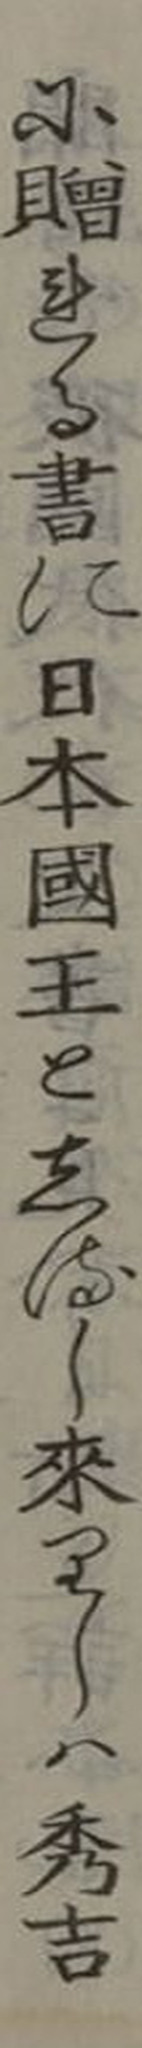に贈れる書に日本國王としるし來りしハ秀吉
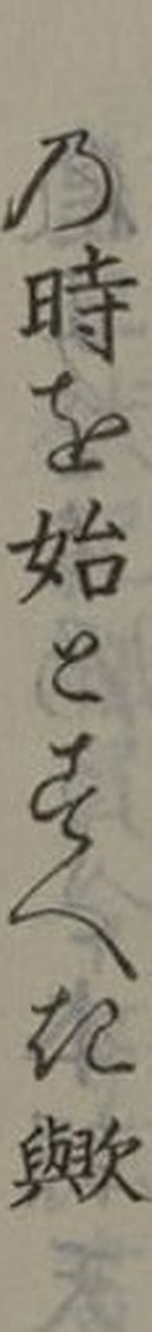の時を始とすへき歟
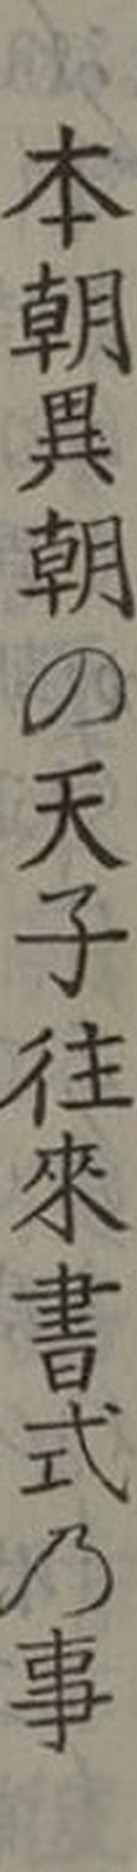本朝異朝の天子往來書式の事
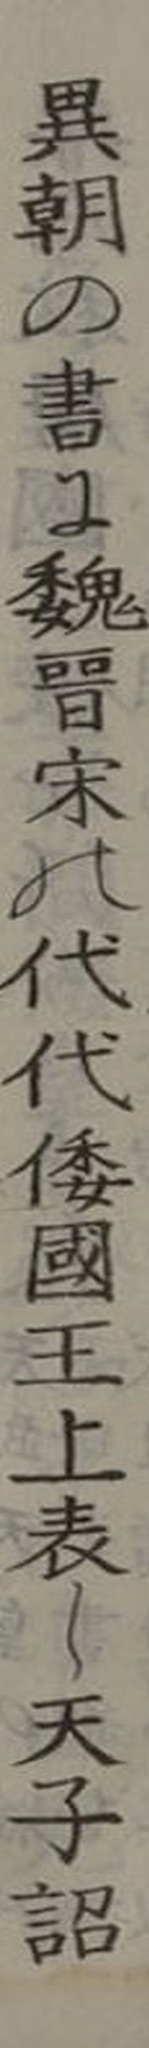異朝の書に魏𣈆宋の代代倭國王上表し天子詔
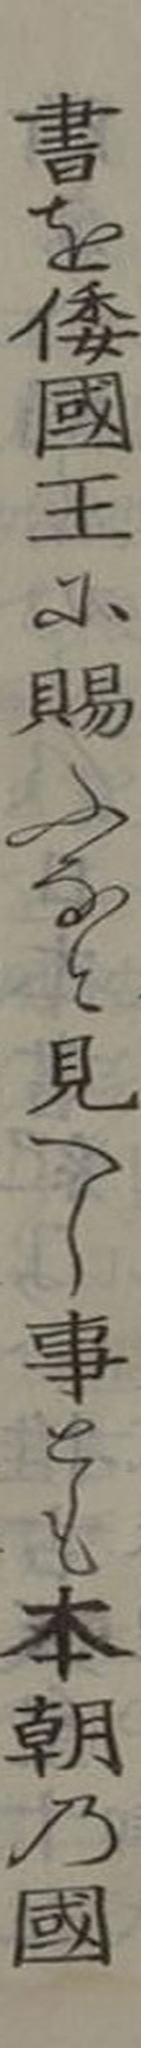書を倭國王に賜ふなと見へし事とも本朝の國
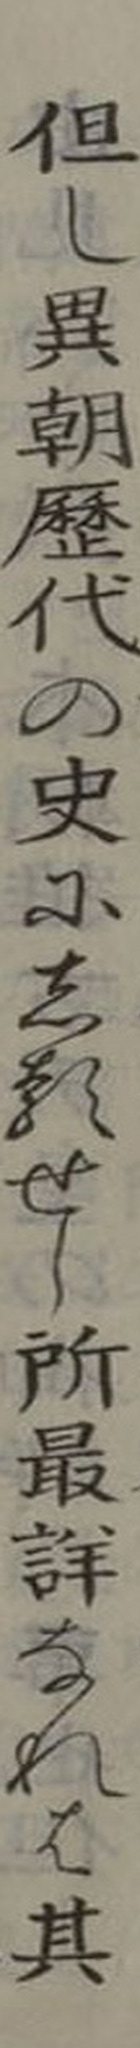但し異朝歷代の史にしるせし所最詳なれは其
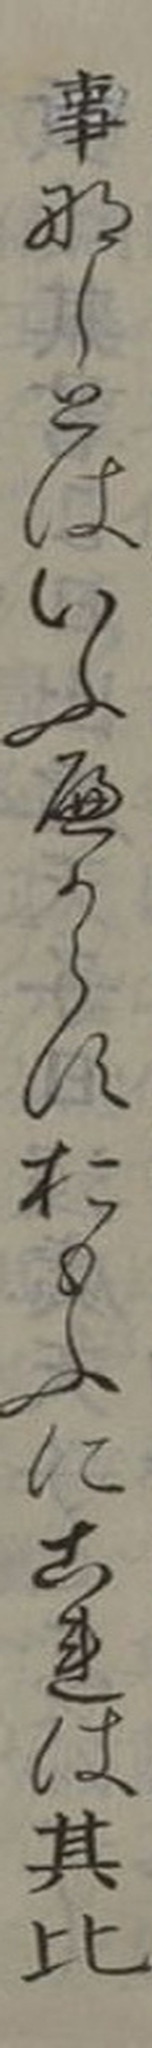事なしとはいふへからすおもふにこれは其比
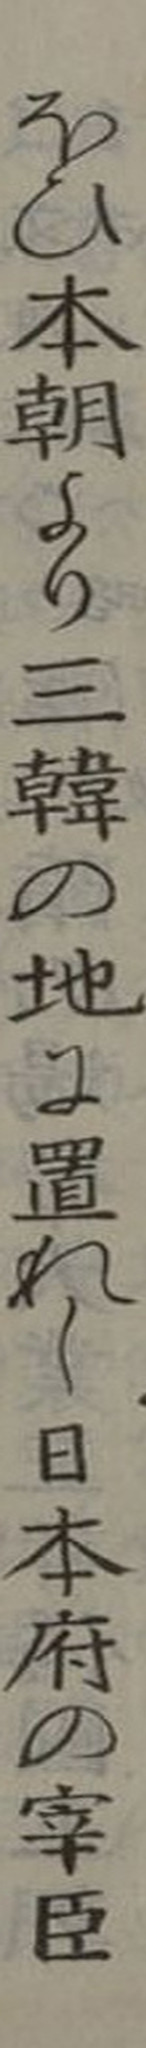ほひ本朝より三韓の地に置れし日本府の宰臣
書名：骨董録
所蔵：University of the Ryukyus Library
